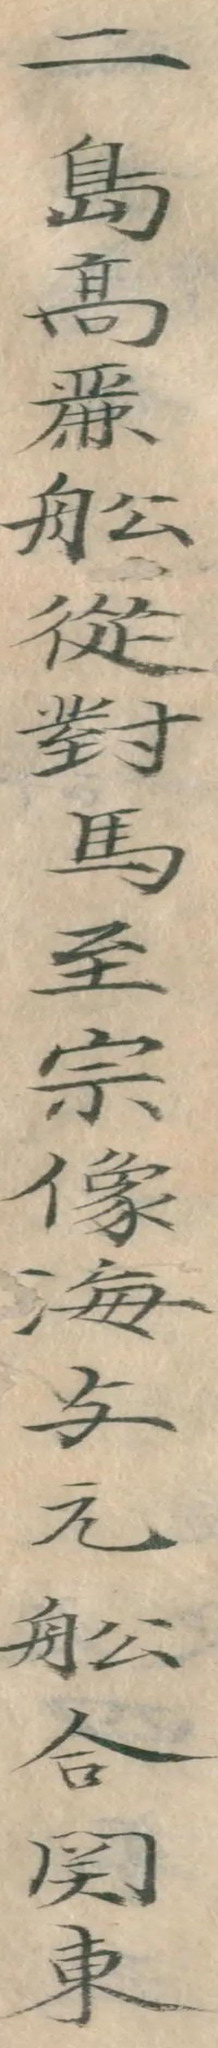二島高麗船従対馬至宗像海与元船合関東
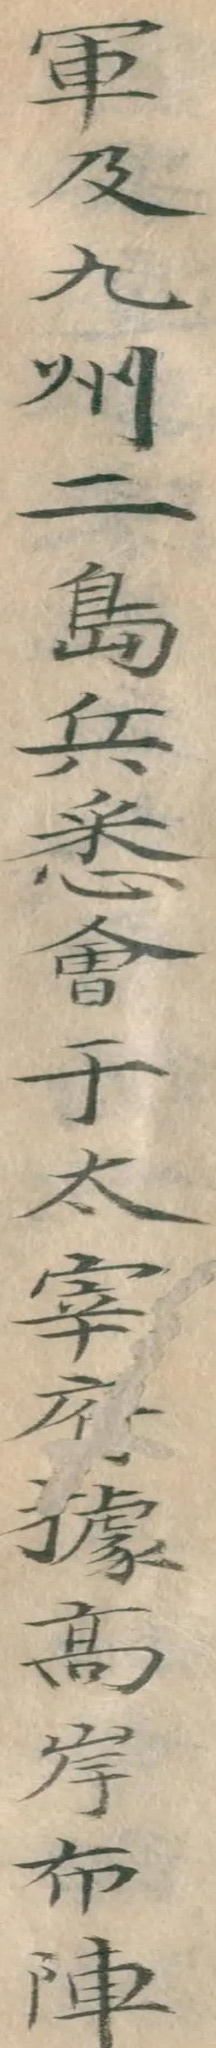軍及九州二島兵悉会于太宰府拠高岸布陣
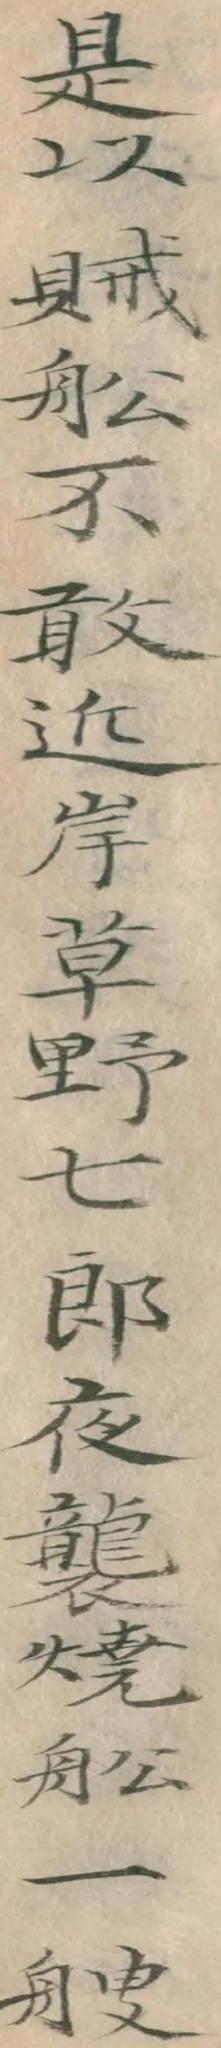是以賊船不敢近岸草野七郎夜襲焼船一艘
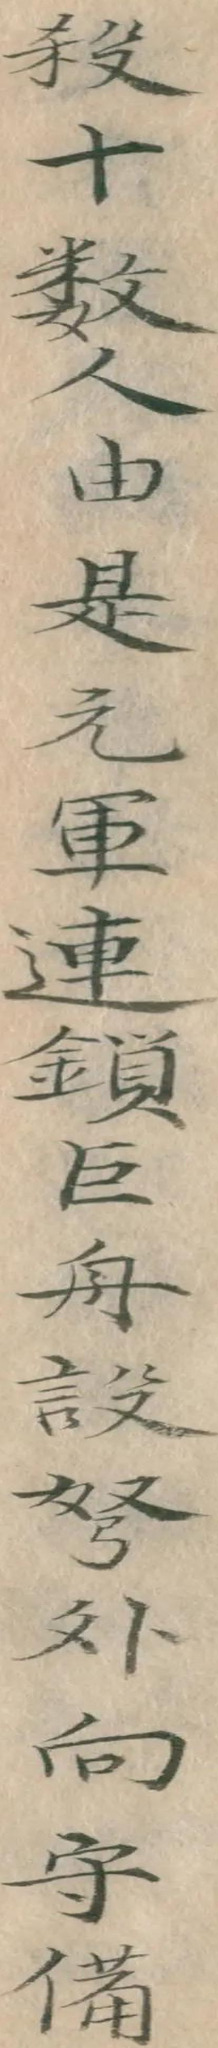殺十数人由是元軍連鎖巨舟設弩外向守備
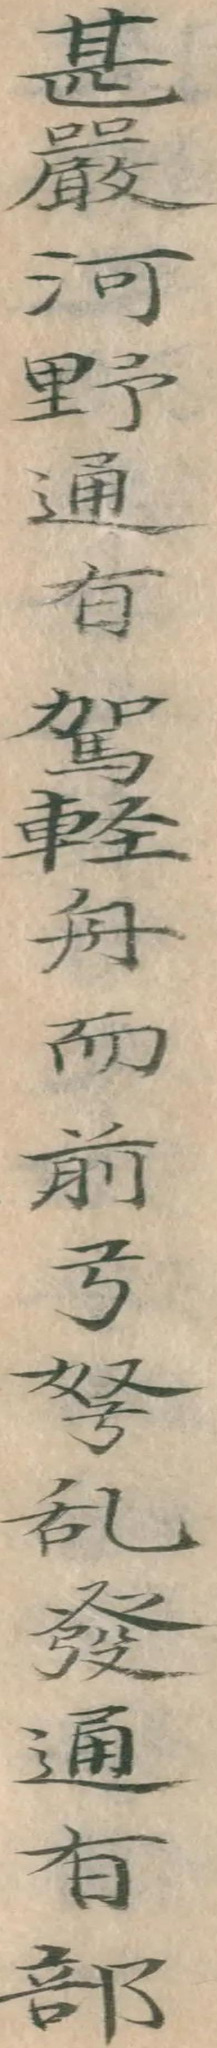甚厳河野通有駕軽舟而前弓弩乱発通有部
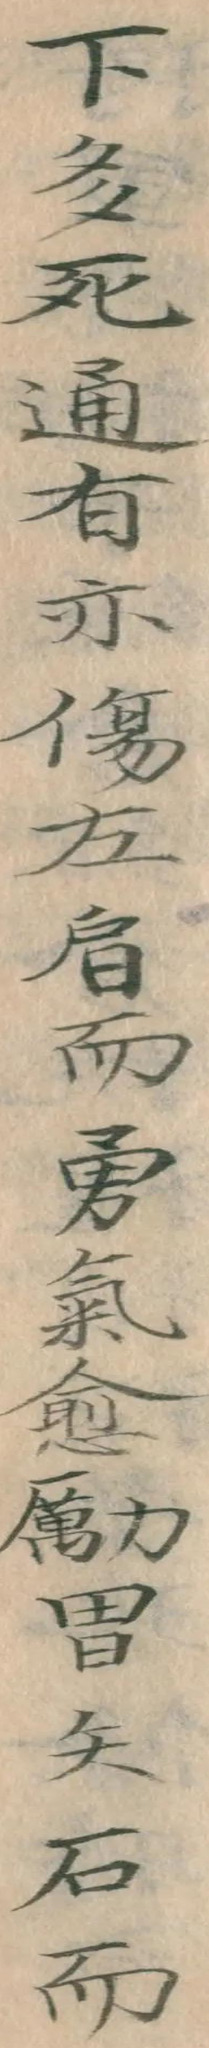下多死通有亦傷左肩而勇気愈励冑？矢石而
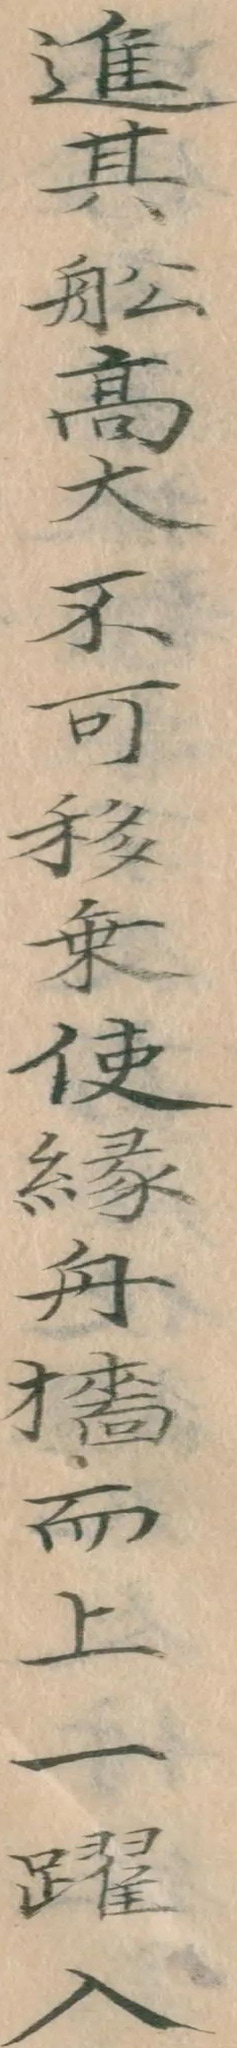進其船高大不可移乗使縁舟檣而上一躍入
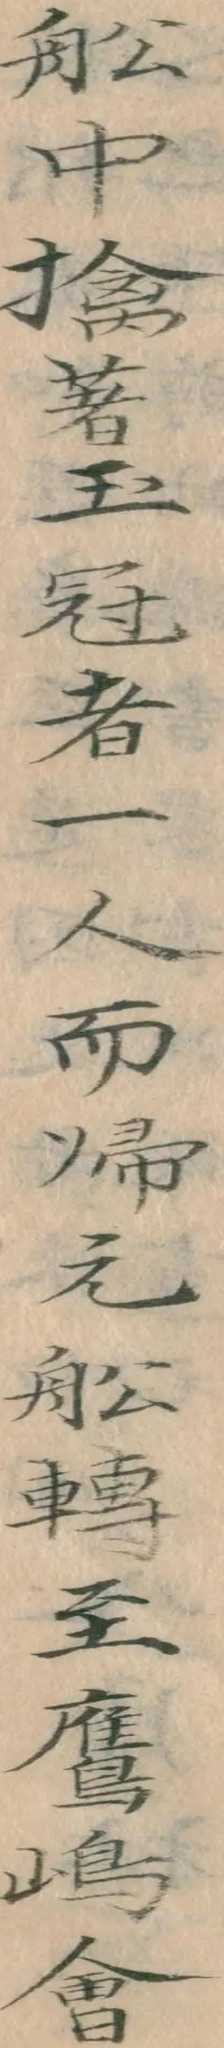船中擒著玉冠者一人而帰元船転至鷹嶋会
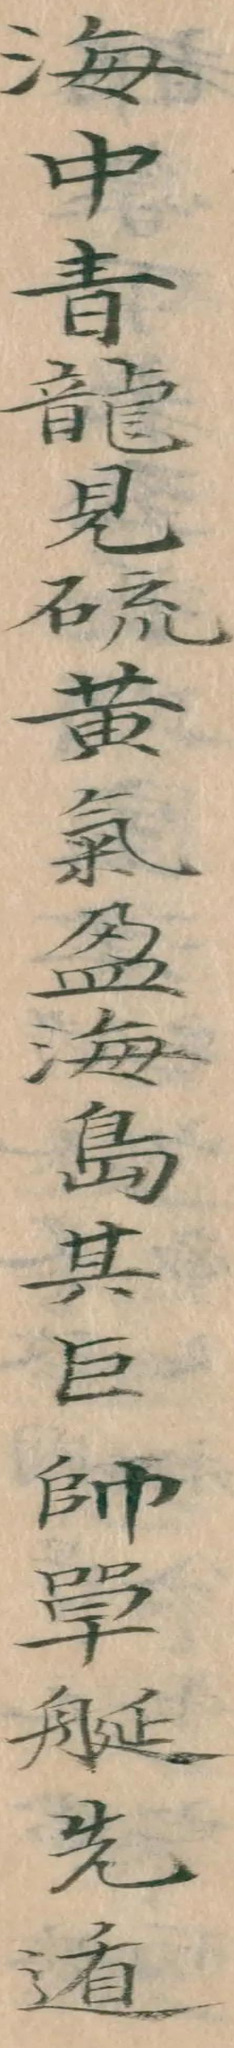海中青龍見硫黄気盈海島其巨帥単艇先遁
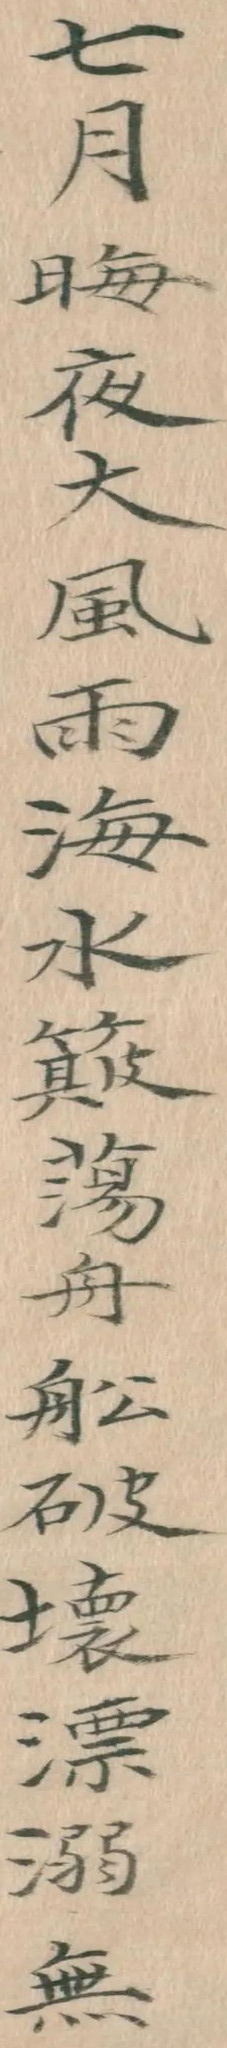七月晦夜大風雨海水簸蕩舟船破壊漂溺無
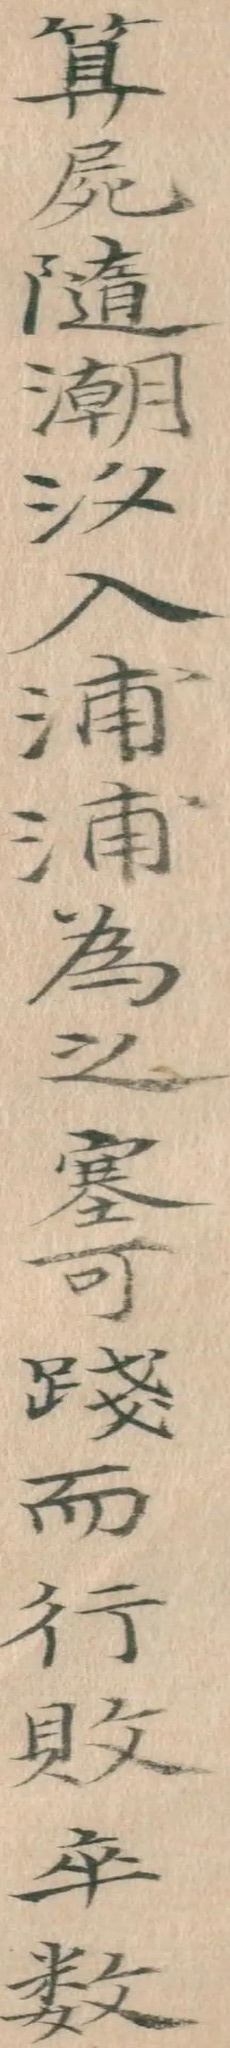算屍隨潮汐入浦浦為之塞可践而行敗卒数
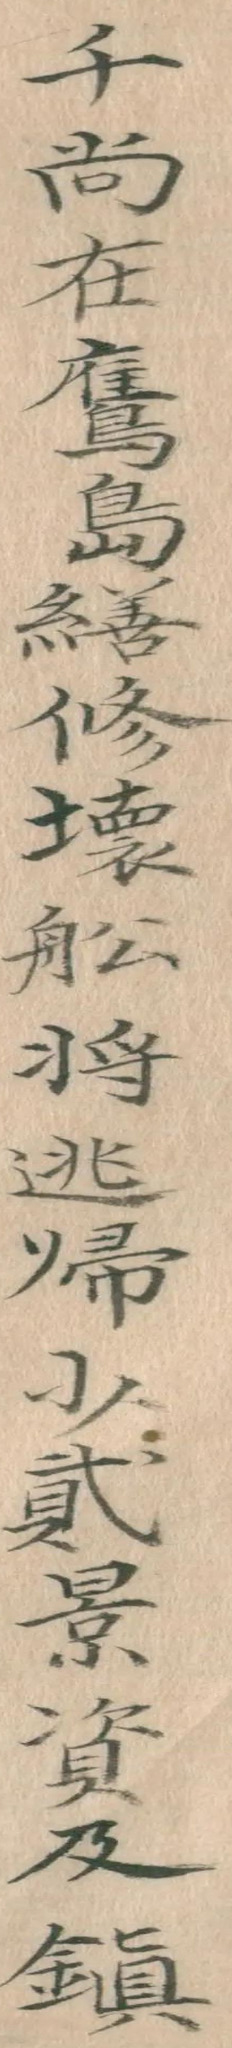千尚在鷹島繕修壊船将逃帰少弐景資及鎮
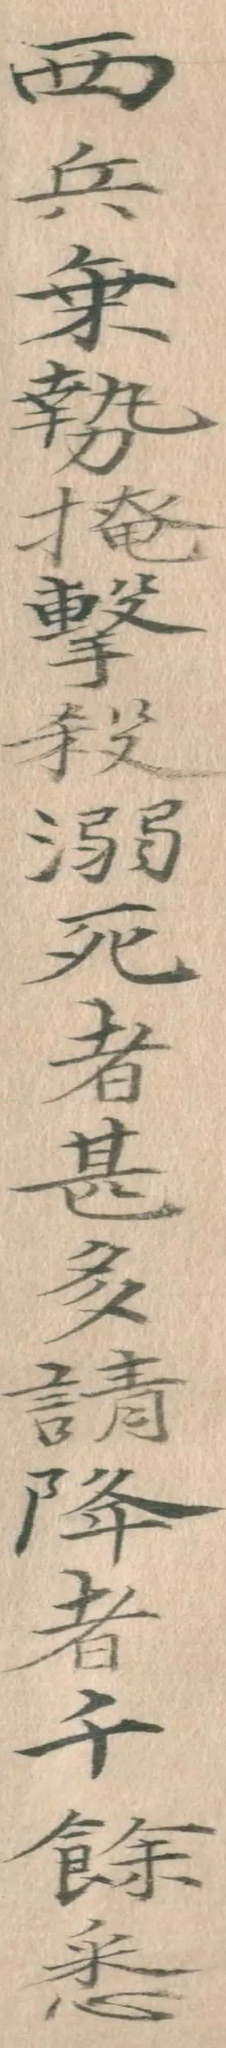西兵乗勢掩撃殺溺死者甚多請降者千余悉
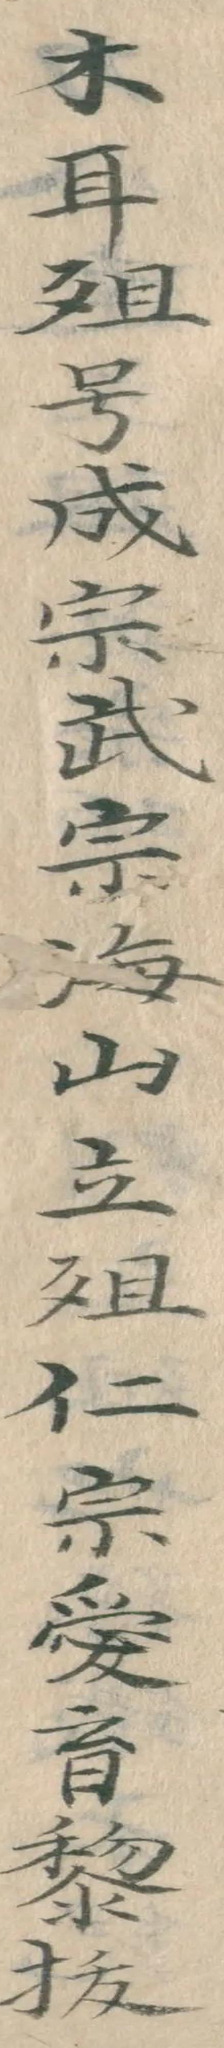木耳殂号成宗武宗海山立殂仁宗愛育黎抜

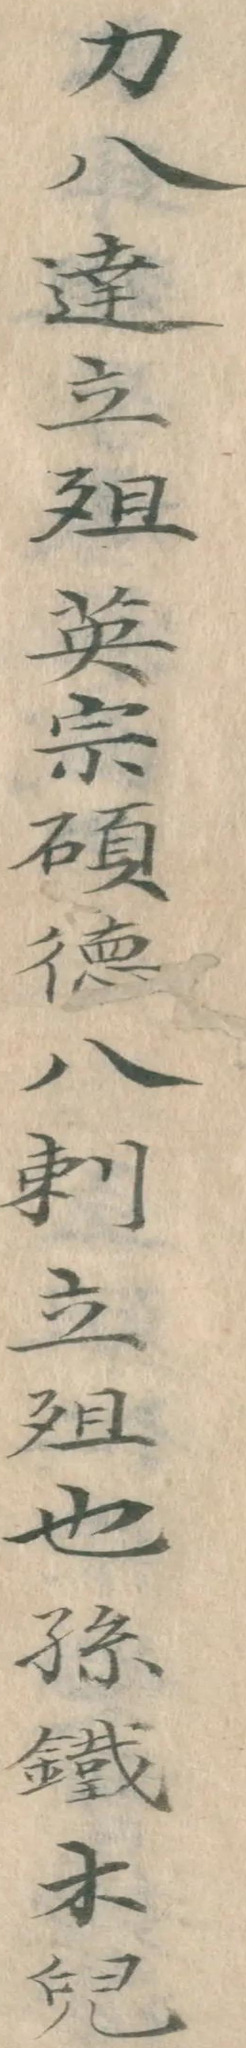力八達立殂英宗碩徳八剌立殂也孫鐵木兒
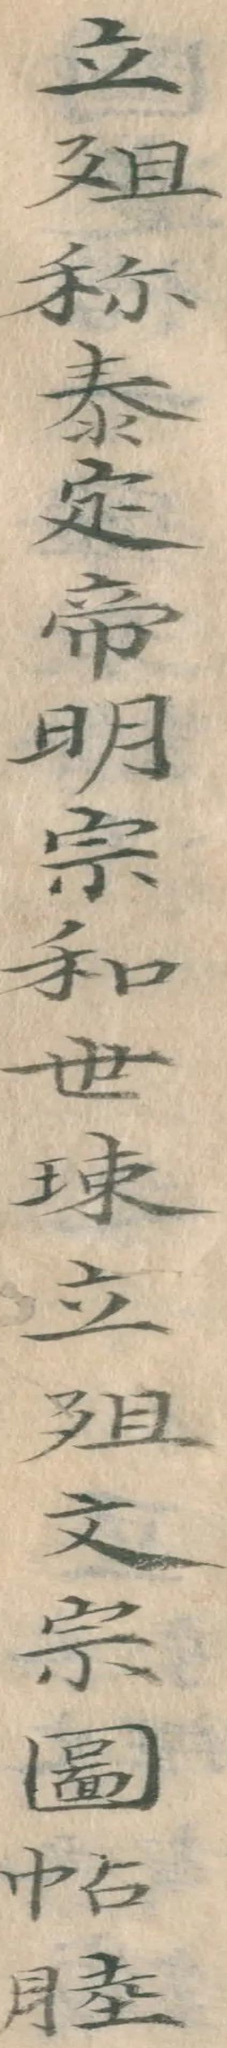立殂称泰定帝明宗和世㻋立殂文宗圖帖睦
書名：輪池叢書. 12
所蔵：国立国会図書館 National Diet Library, JAPAN
